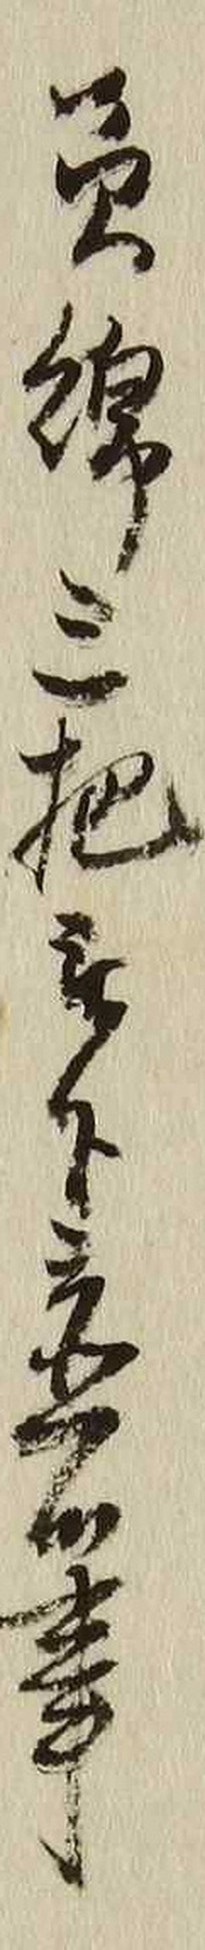美綿三把被下置候事
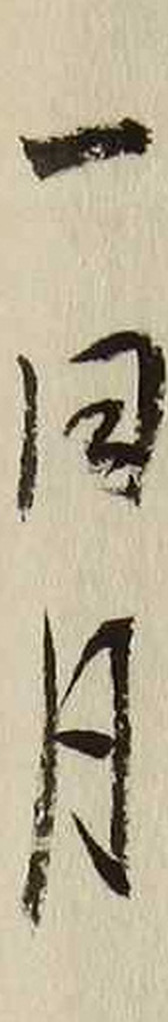一同月
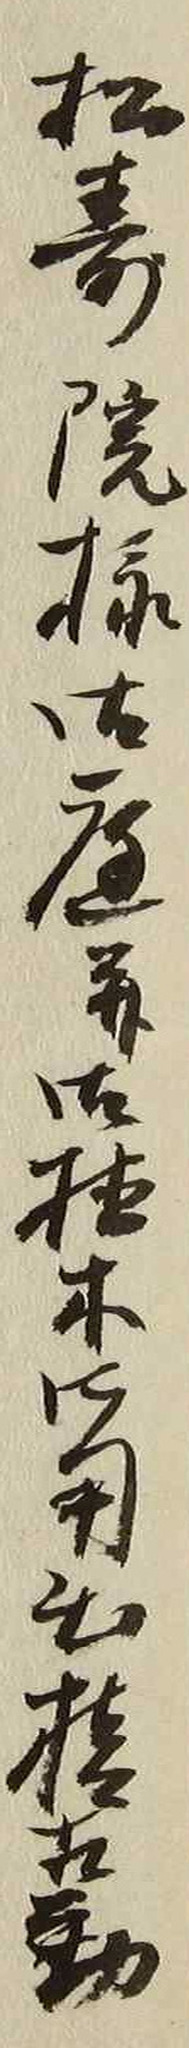松寿院様御庭并御植木御用出精相勤
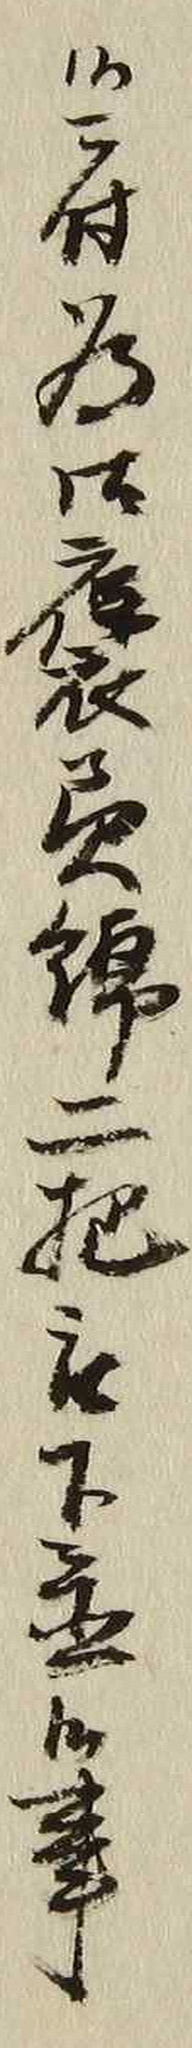候ニ付為御褒美綿二把被下置候事
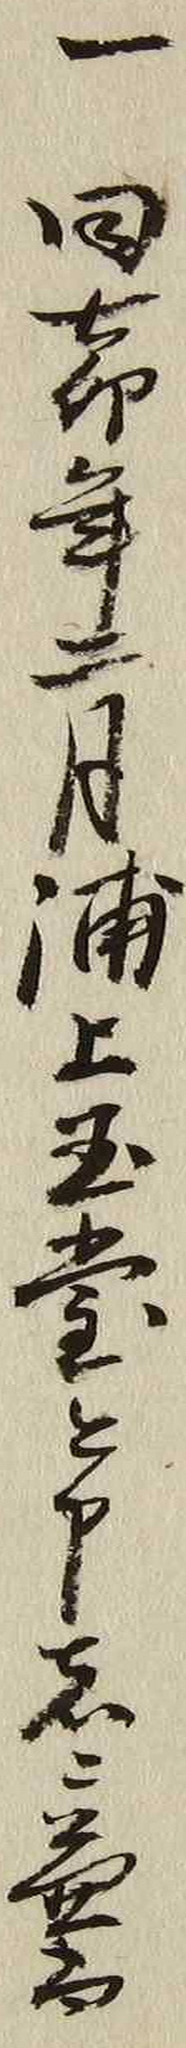一同七卯年二月浦上玉堂と申者ニ兼而
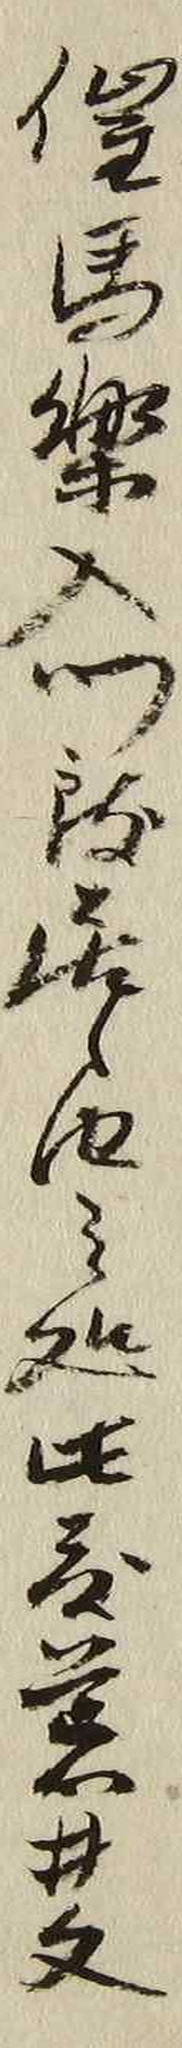催馬楽入門致居候由之処此度荒井文
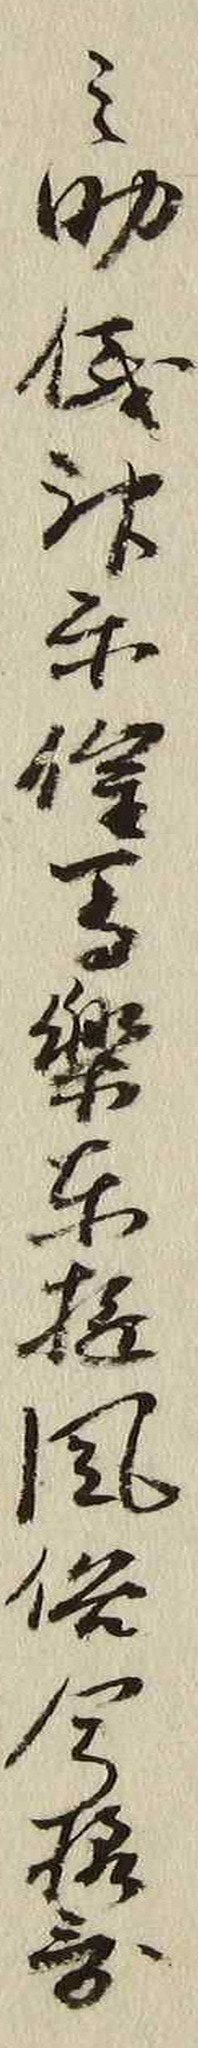之助儀神楽催馬楽東遊風俗今様歌等
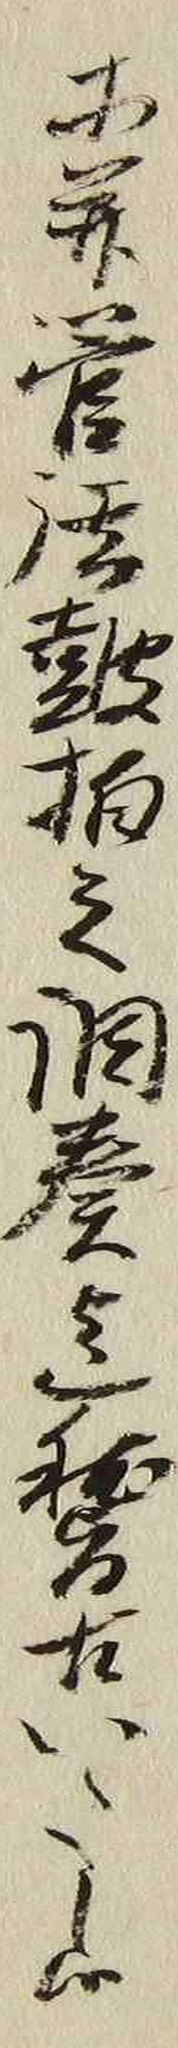并管弦鼓拍之調奏迄稽古いたし候
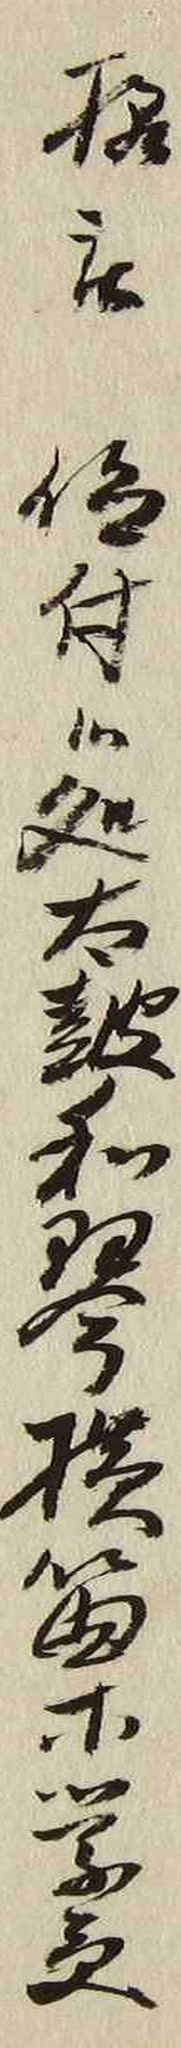様被仰付候処太鼓和琴横笛等学受
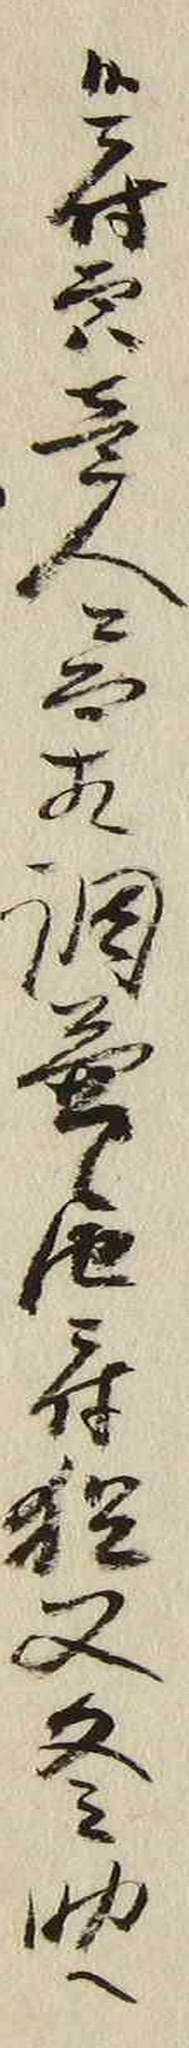候ニ付而ハ壱人ニ而相調兼候由ニ付猶又文之助へ
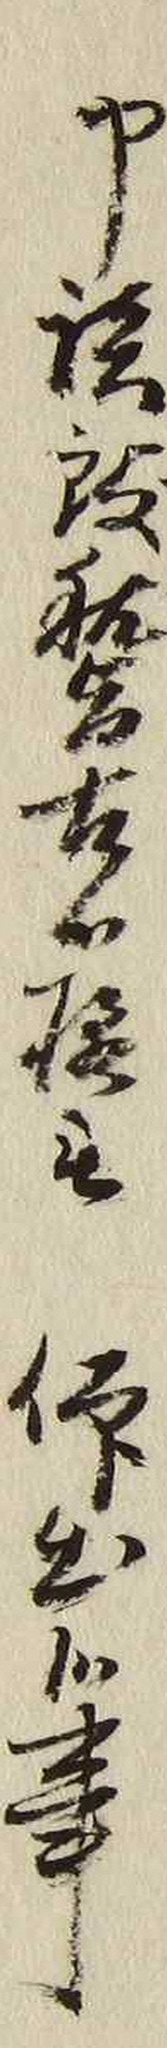申談致稽古候様被仰出候事
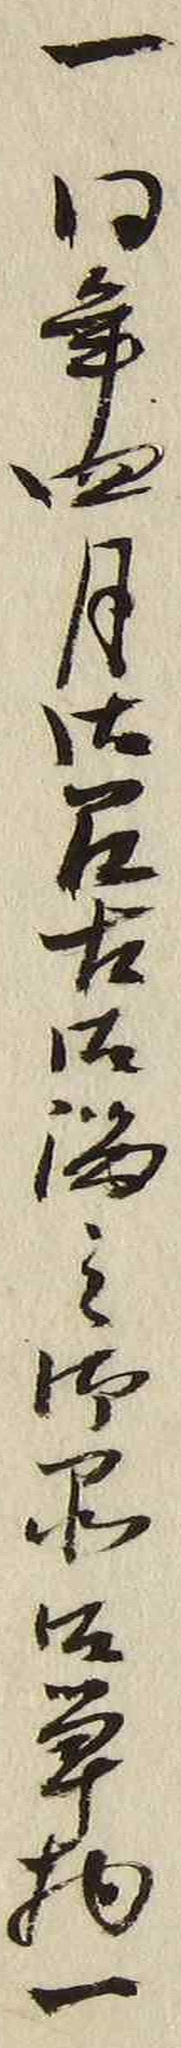一同年四月御召古御溜之御品御単物一

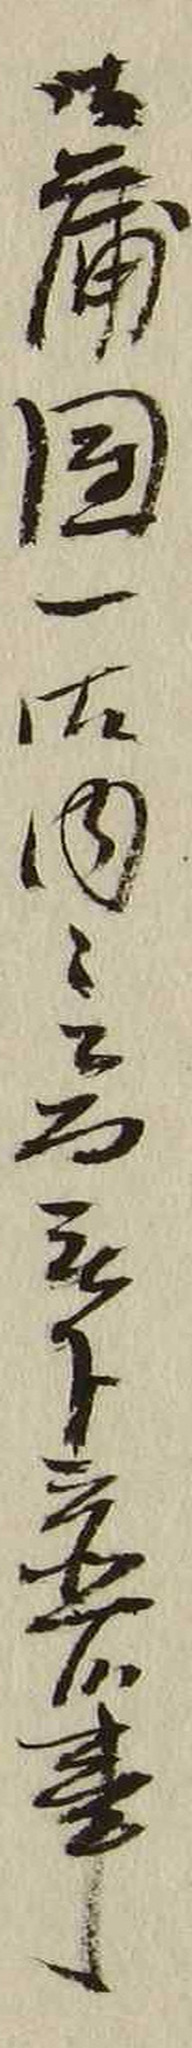御蒲団一御内々ニ而被下置候事
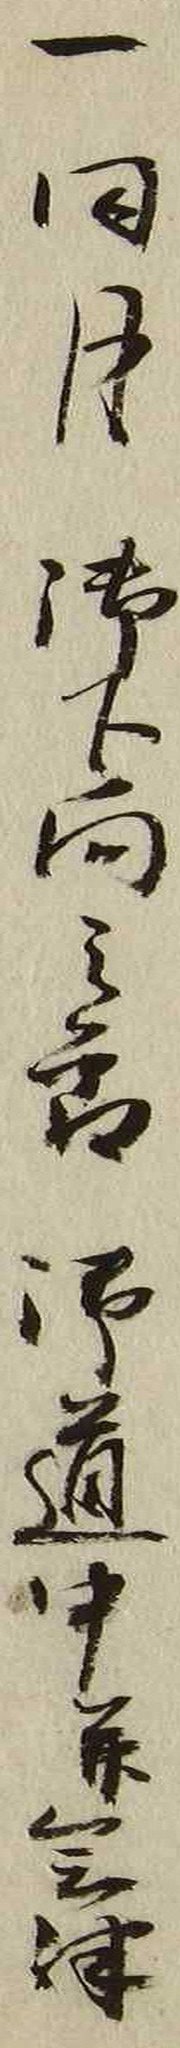一同月御下向之節御道中并会津
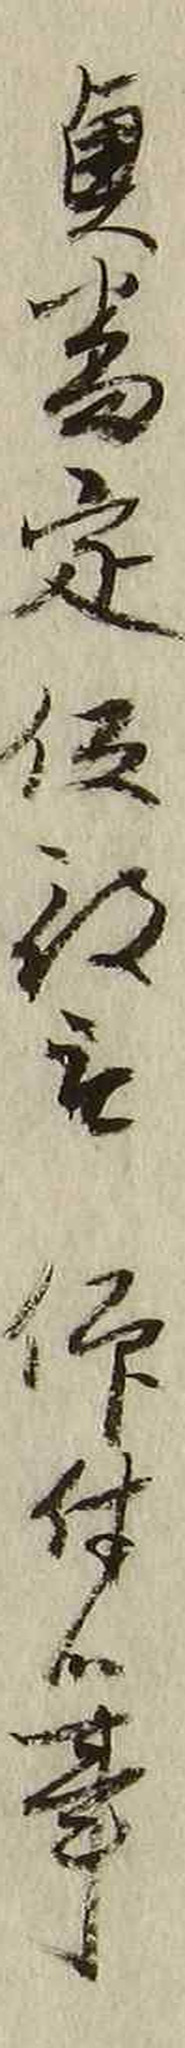奥番定仮役被仰付候事
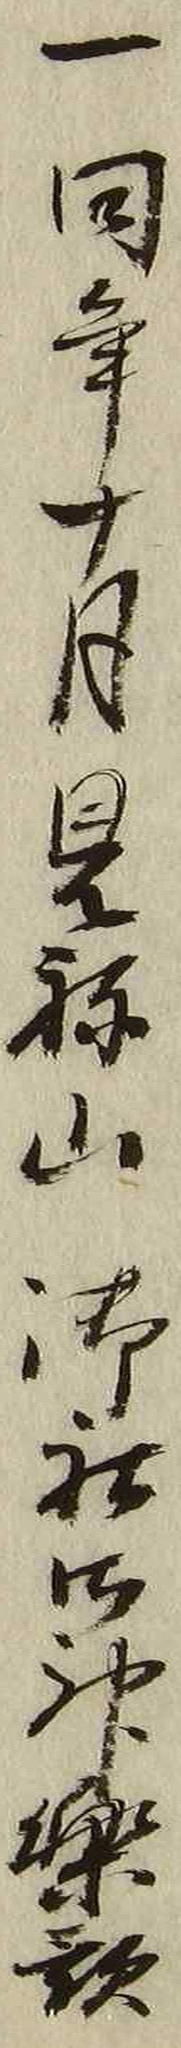一同年十月見祢山御社御神楽歌
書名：諸士系譜　巻之345　も之部1
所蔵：会津若松市立会津図書館
